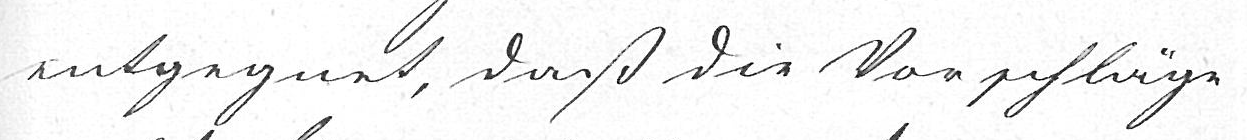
entgegnet, daß die Vorschläge
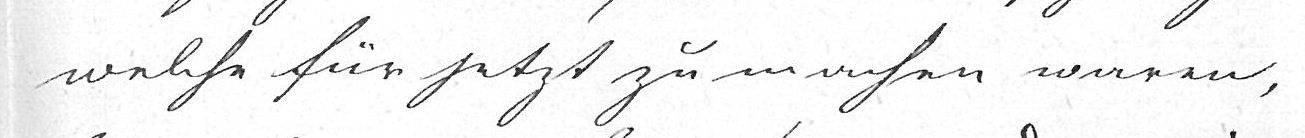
welche für jetzt zu machen waren,
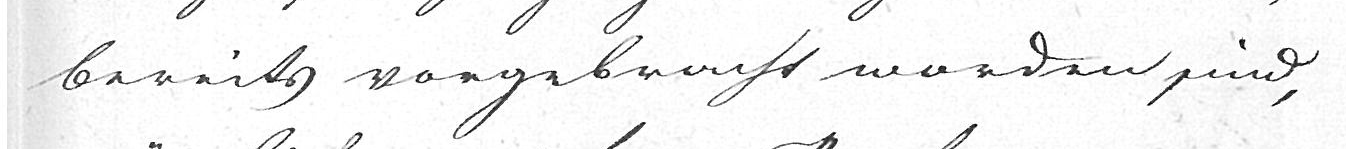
bereits vorgebracht worden sind,
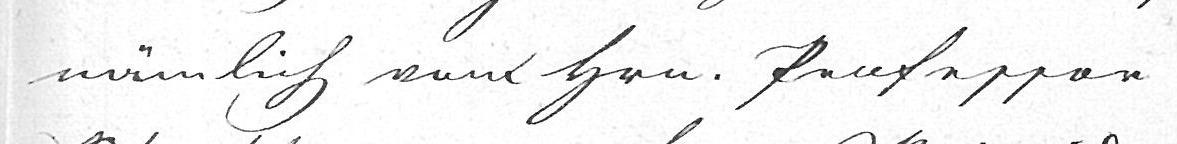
nämlich vom Hrn. Professor
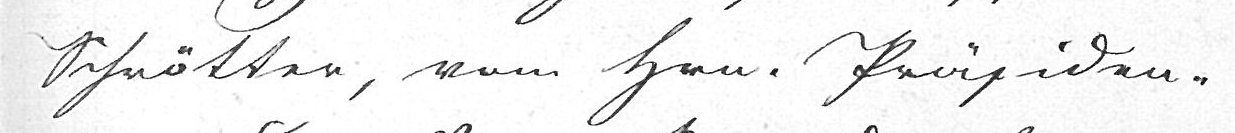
Schrötter, vom Hrn. Präsiden-
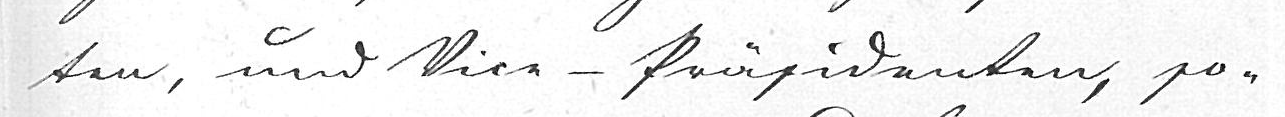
ten, und Vice-Präsidenten, so-
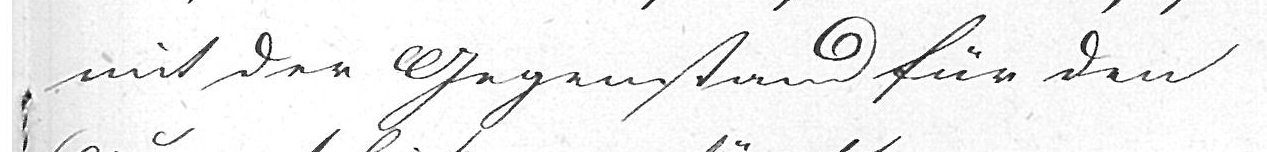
mit der Gegenstand für den
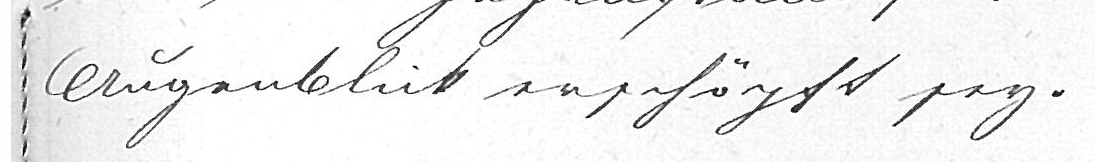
Augenblick erschöpft sey.
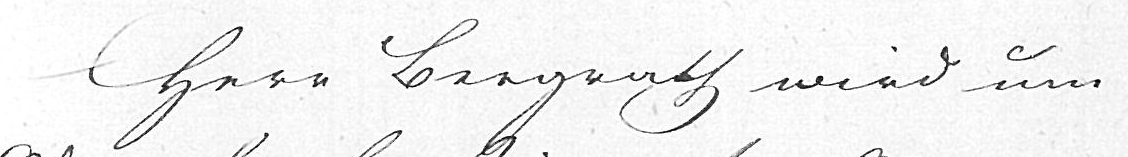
Herr Bergrath wird um
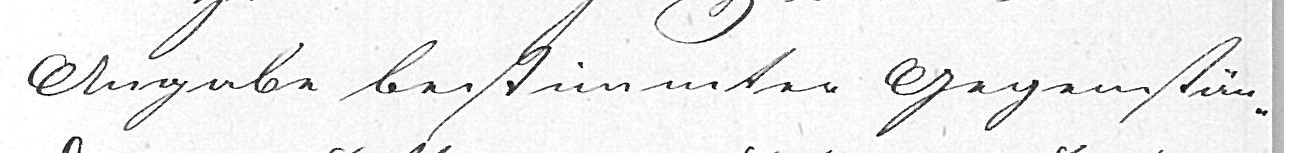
Angabe bestimmter Gegenstän-
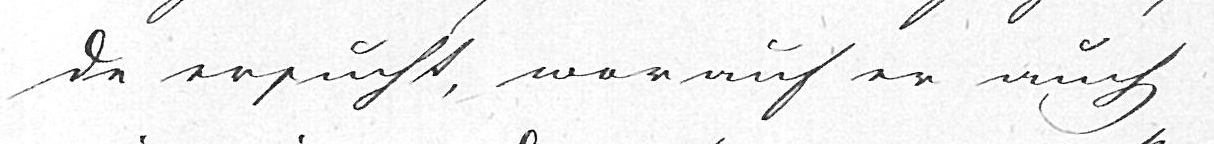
de ersucht, worauf er auch
